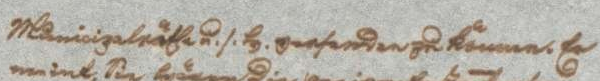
Municipalräthe u. s. w. versenden zu können. Er
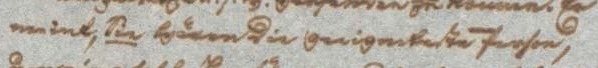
meint, Sie wären die geeignete Person,
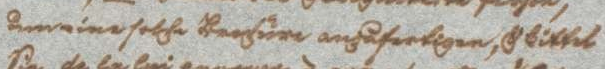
um eine solche Brochüre anzufertigen, & bittet
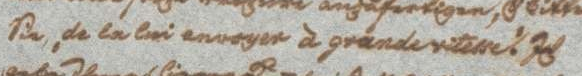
Sie, «de la lui envoyer à grande vitesse». Ich
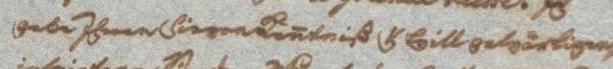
gebe Ihnen hievon Kenntniß & will gewärtigen,
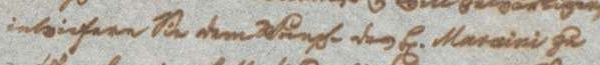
inwiefern Sie dem Wunsche des Hr. Maraini zu
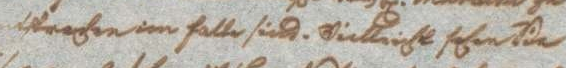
entsprechen im Falle sind. Vielleicht sehen Sie
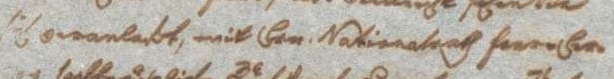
veranlaßt, mit Hrn. Nationalrath Feer-Her-
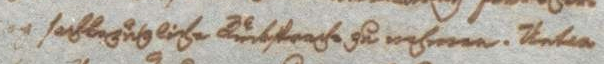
zog sachbezügliche Rücksprache zu nehmen. Unter
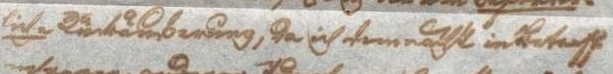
liche Rückäußerung, da ich demnächst in Betreff
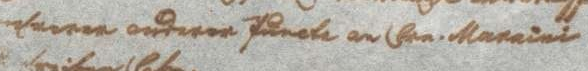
mehrerer anderer Puncte an Hrn. Maraini
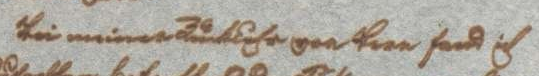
Bei meiner Rückkehr von Bern fand ich
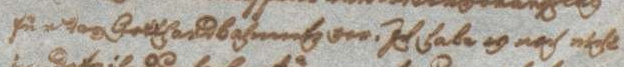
für das Gotthardbahnnetz vor. Ich habe es noch nicht
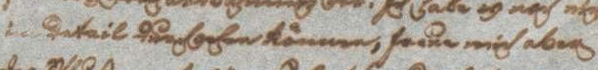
im Detail durchgehen können, freue mich aber
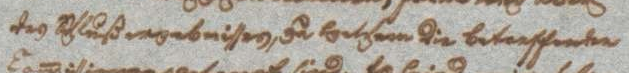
des Schlußergebnisses, zu welchem die betreffenden
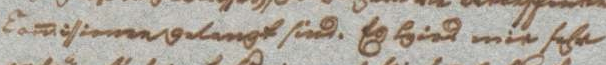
Commissionen gelangt sind. Es wird mir sehr
